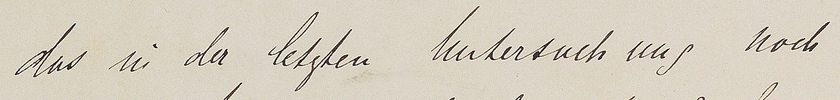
das in der letzten Untersuchung noch
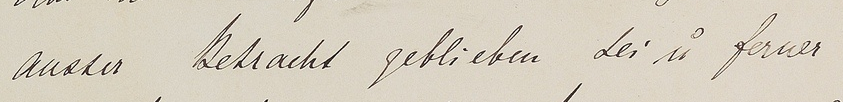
ausser Betracht geblieben sei u ferner
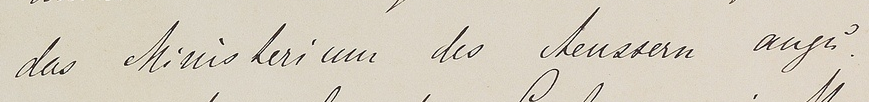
das Ministerium des Aeussern anzu-
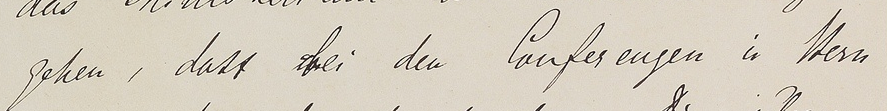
gehen, dass bei den Conferenzen in Bern
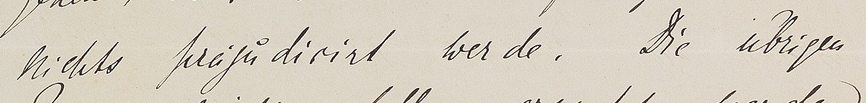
nichts präjudicirt werde. Die übrigen
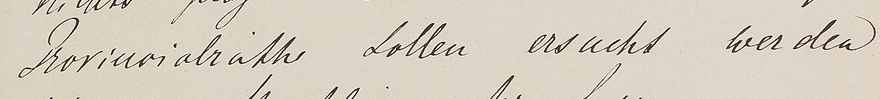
Provincialräthe sollen ersucht werden
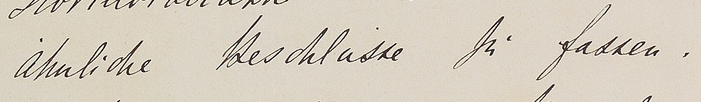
ähnliche Beschlüsse zu fassen.
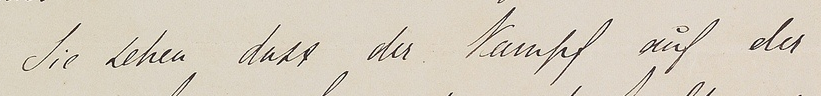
Sie sehen dass der Kampf auf der
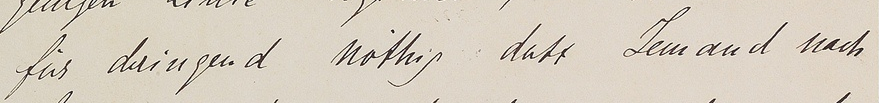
für dringend nöthig dass jemand nach
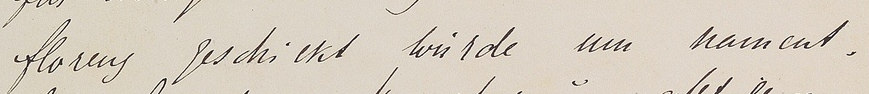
Florenz geschickt würde um nament-
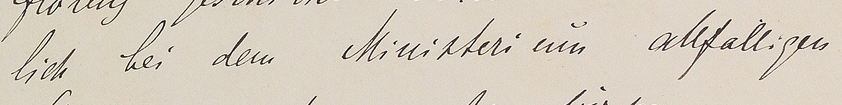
lich bei dem Ministerium allfälligen
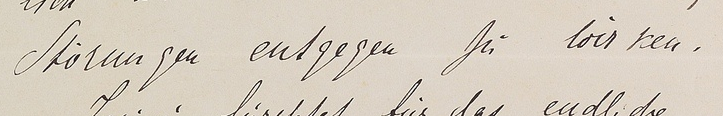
Störungen entgegen zu wirken.
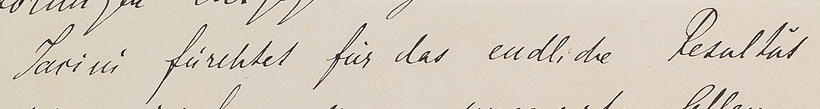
Jacini fürchtet für das endliche Resultat
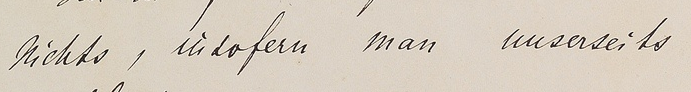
nichts, insofern man unserseits
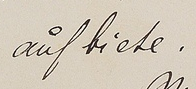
aufbiete.
